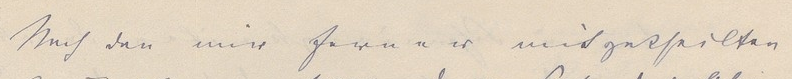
Nach den mir ferner mitgetheilten
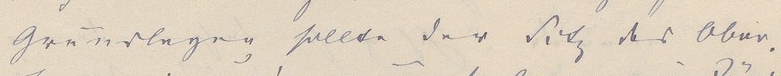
Grundlagen sollte der Sitz des Ober-
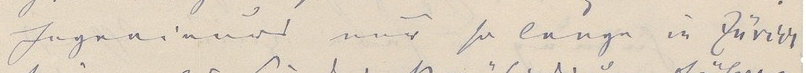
Ingenieurs nur so lange in Zürich
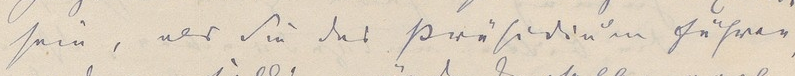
sein, als Sie das Präsidium führen,
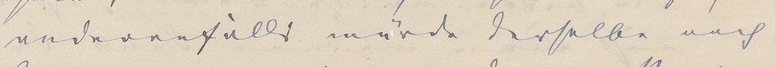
anderenfalls würde derselbe nach
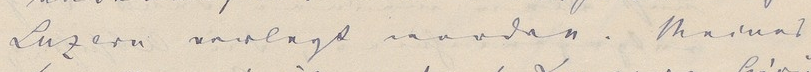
Luzern verlegt werden. Meines
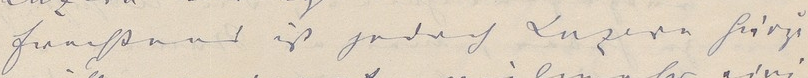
Erachtens ist jedoch Luzern hierzu
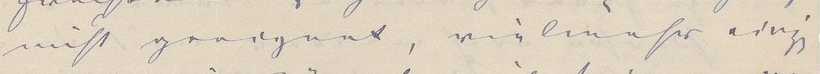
nicht geeignet, vielmehr einzig
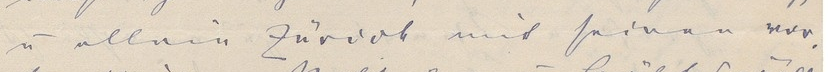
u allein Zürich mit seinen vor-
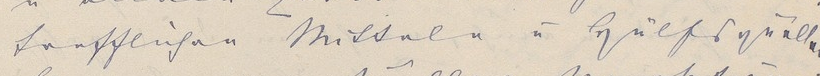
trefflichen Mitteln u Hülfsquellen.
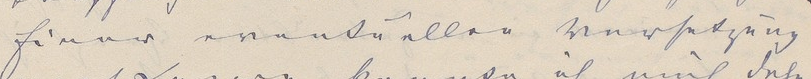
Einer eventuellen Versetzung
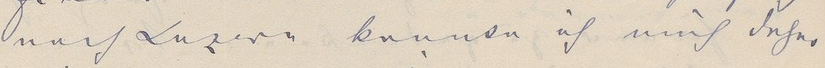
nach Luzern könnte ich mich daher
